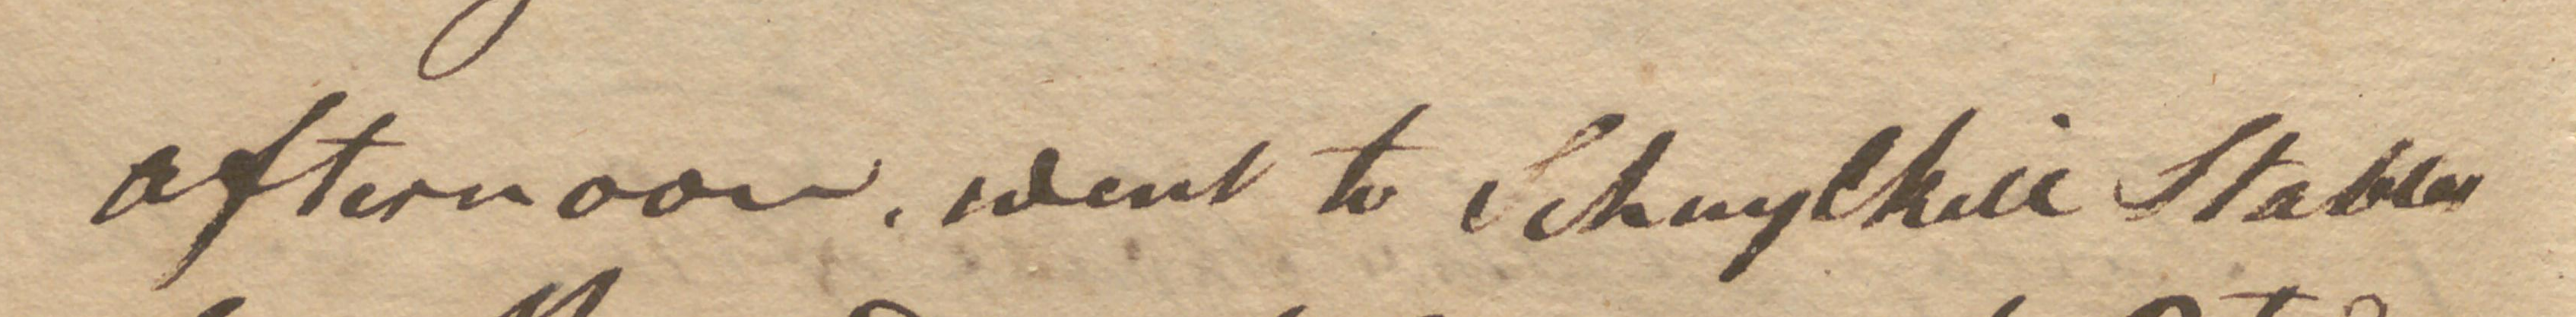afternoon. went to Schuylkill Stables
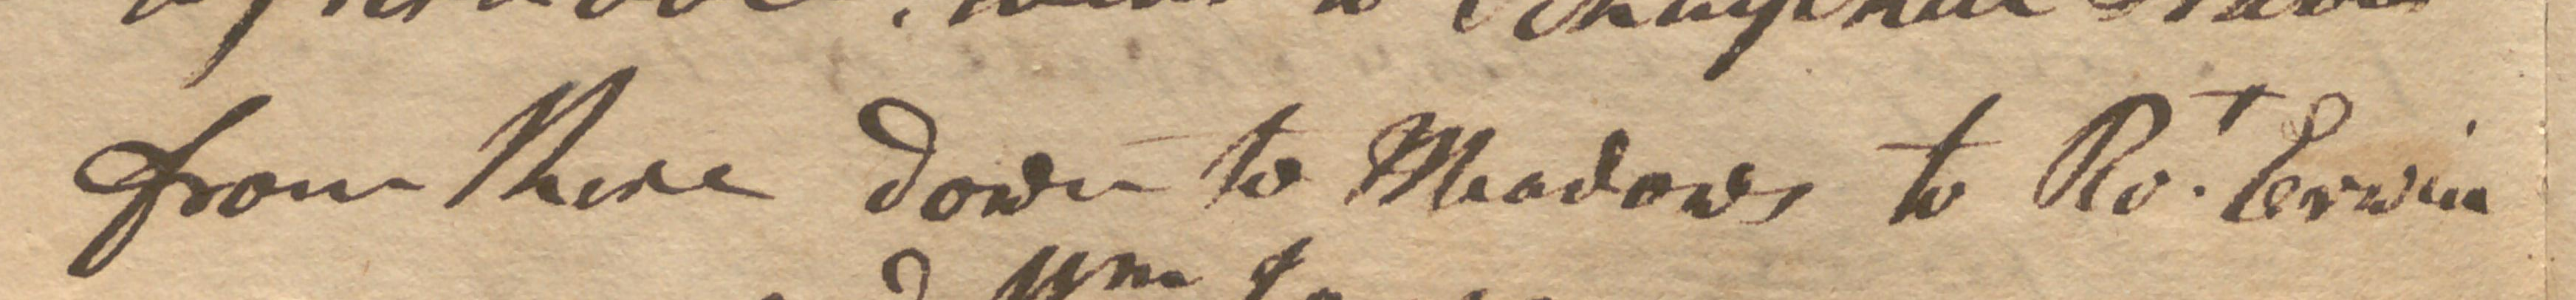from there down to Meadows to Ro^t. Erwin
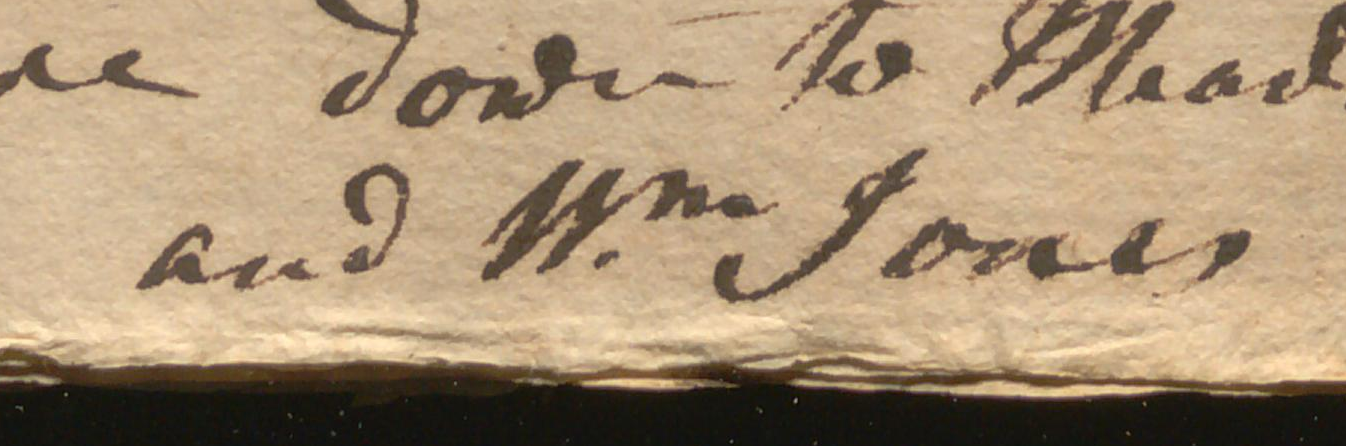and M^m. Jones
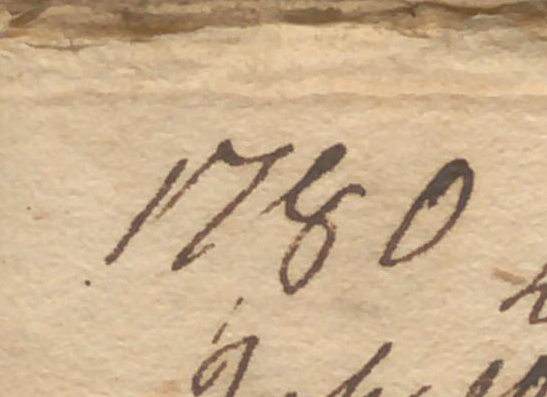1780
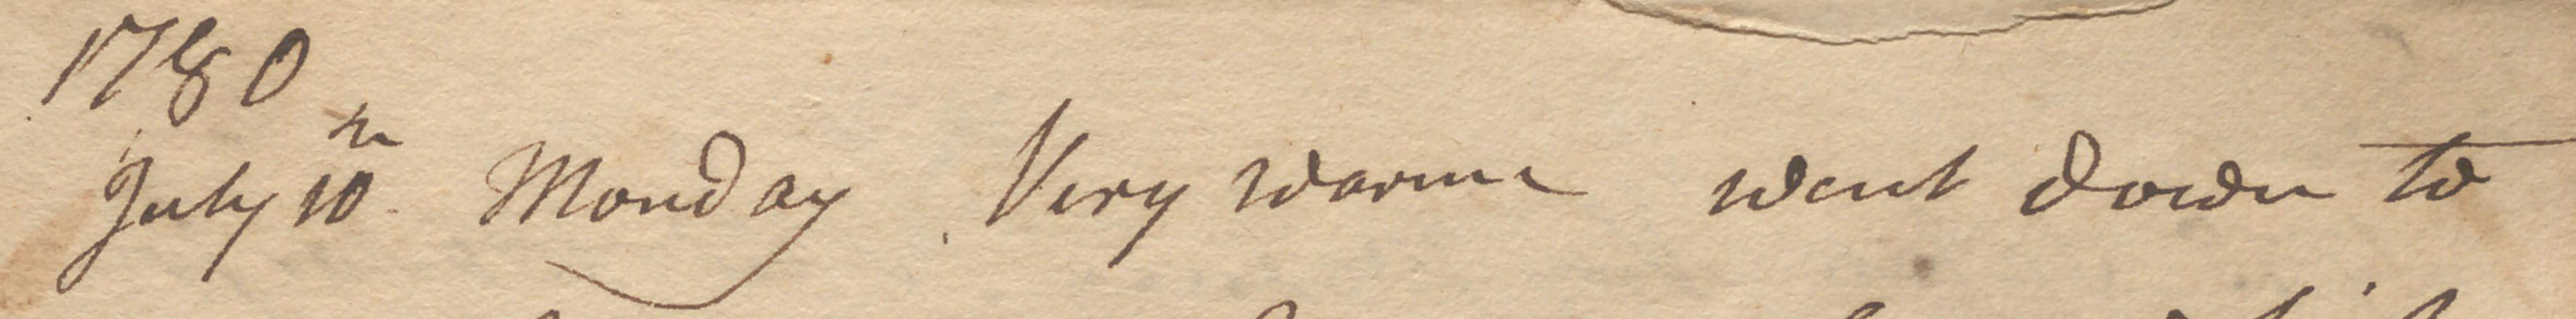July 10^th. Monday Very warme went down to
